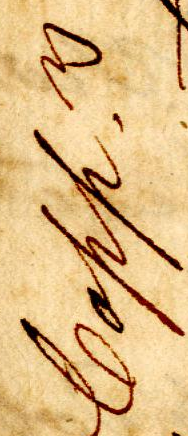Copp^y.
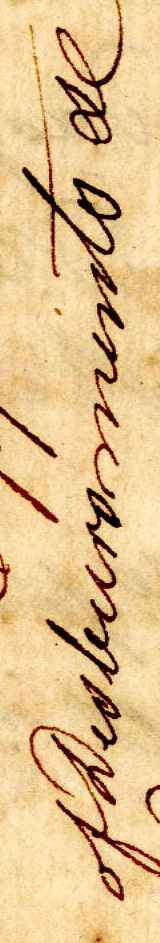of Disbursments &c
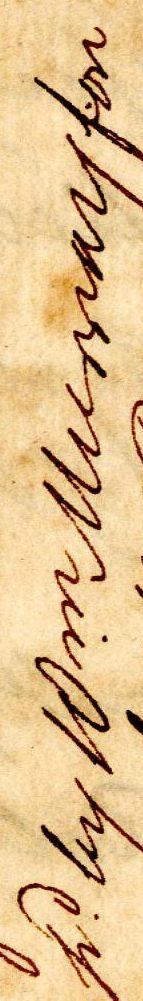h^d. by W^m. Murray for
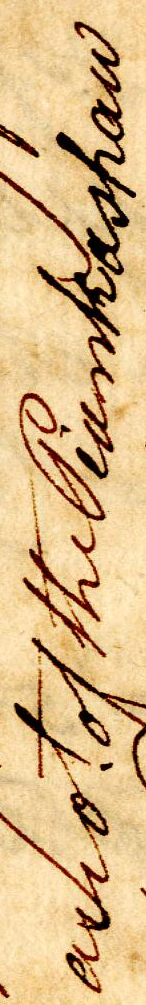amo^t of the Piankashaw
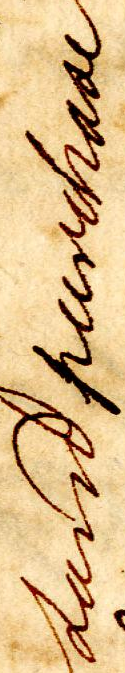Lannd purchase
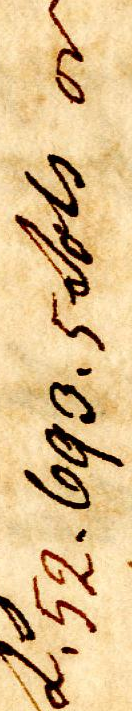L^s. 52.693.5 Sols or
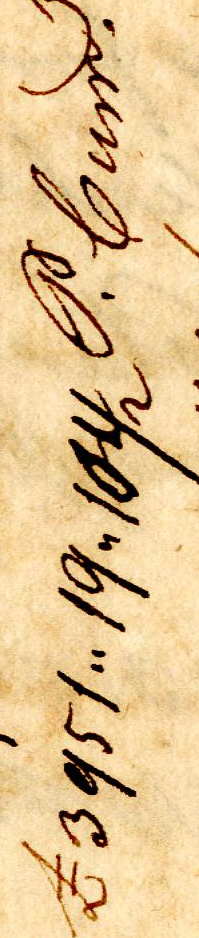£ 3951..19. 10 1/2 P. Curr^y.
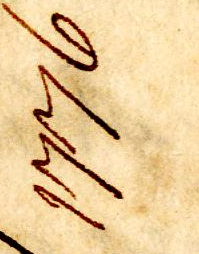1776
